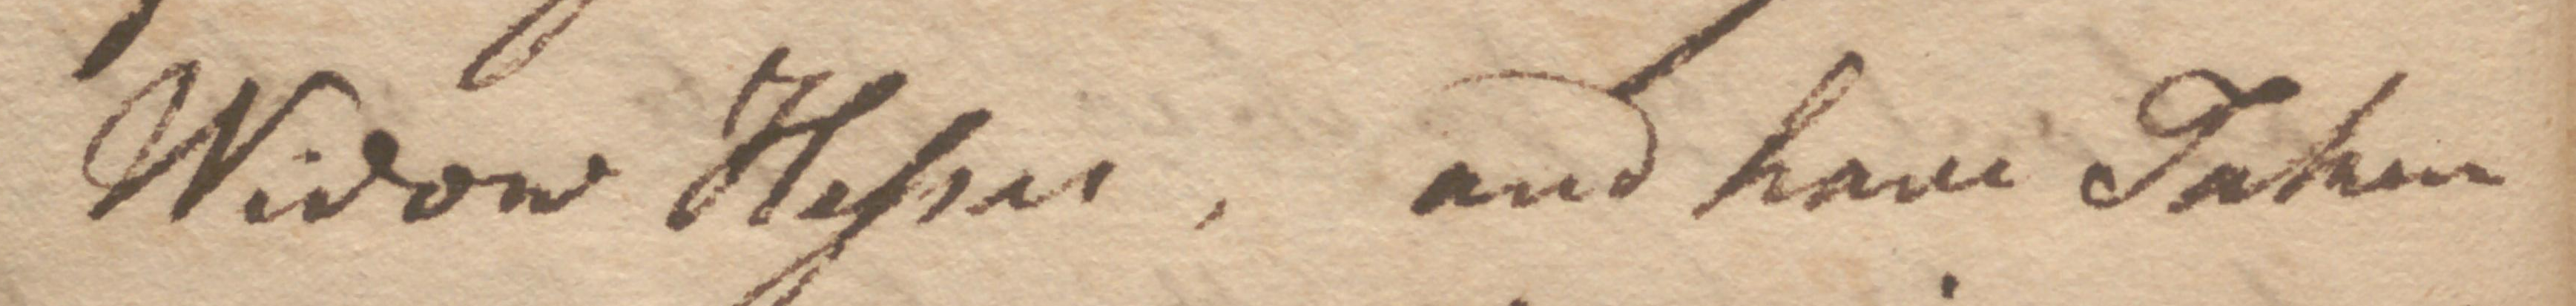Widow Hesses, and have Taken
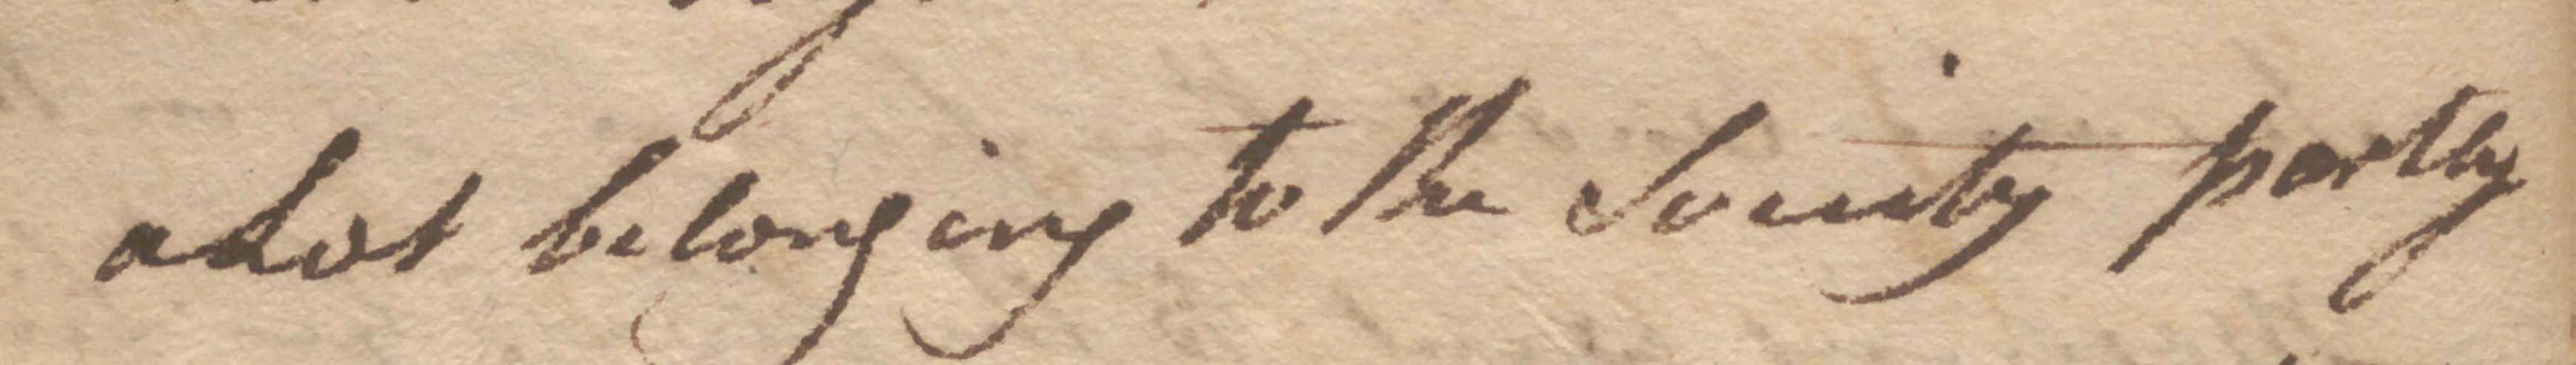a Lot belonging to the Society partly
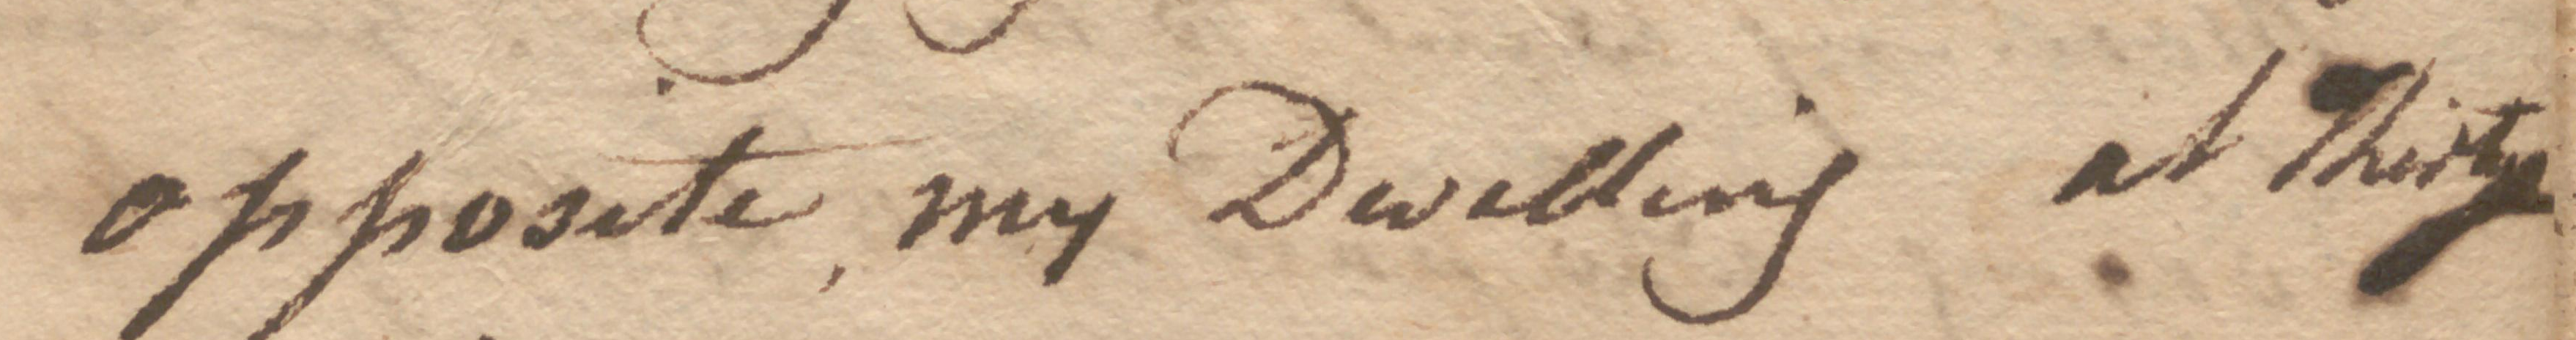opposite my Dwvelling at Thirty
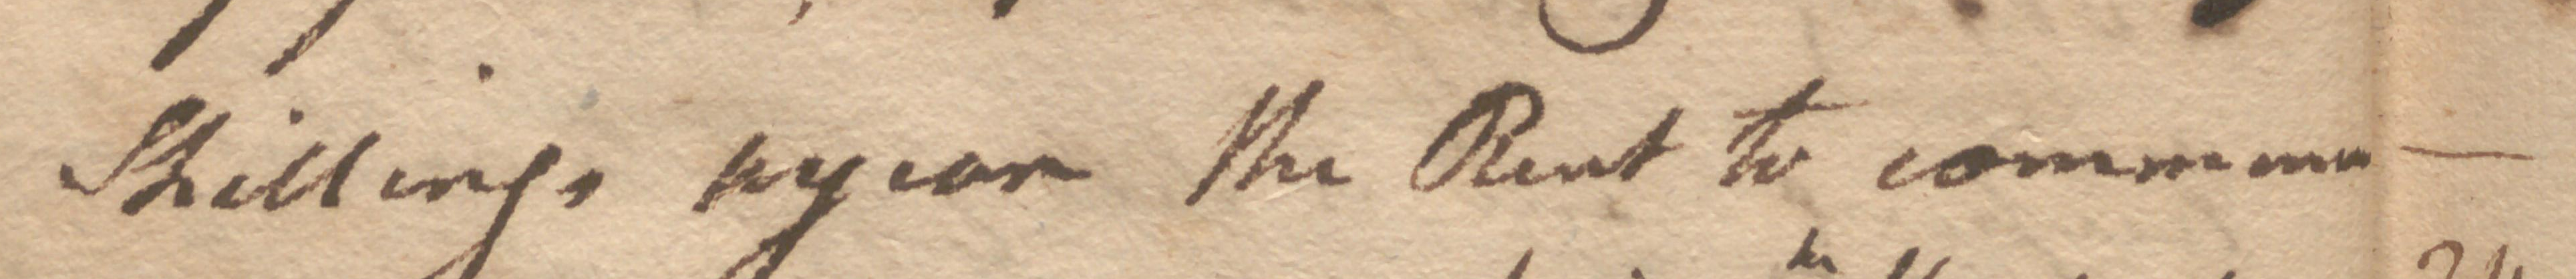Shillings a year the Rent to come in on
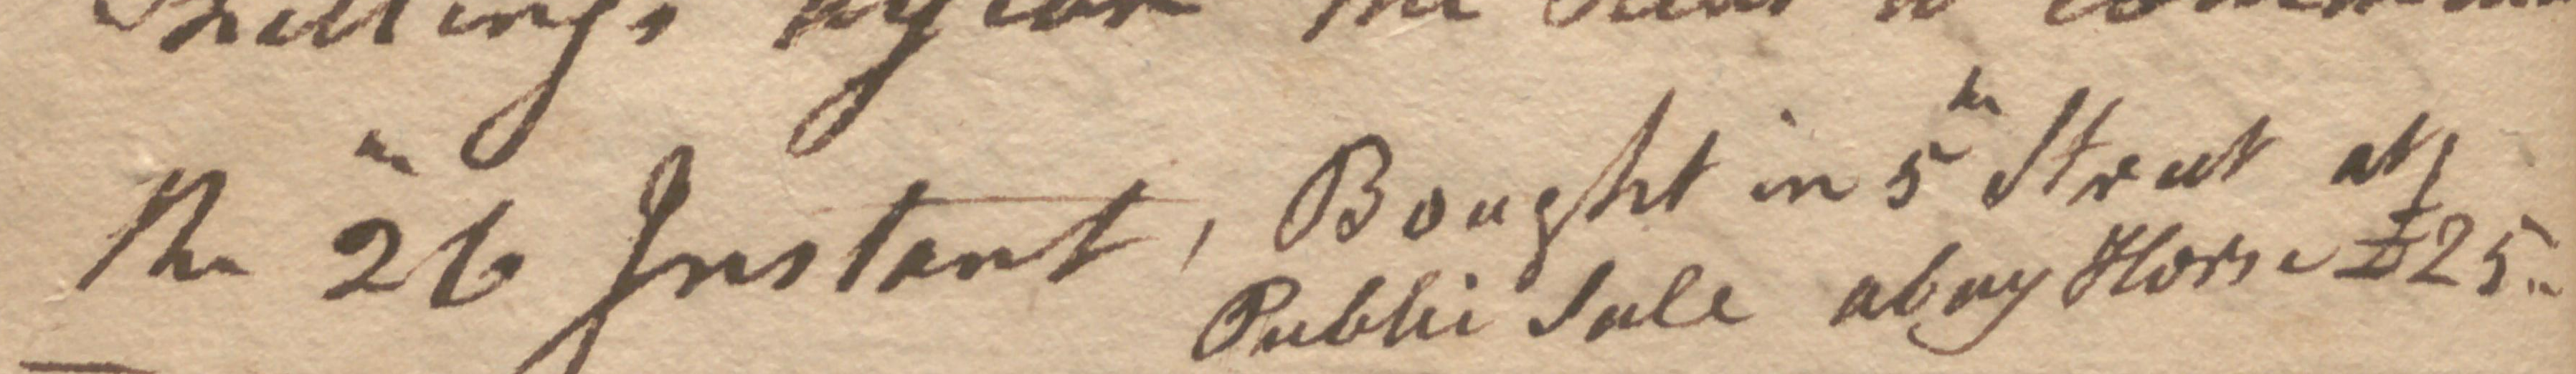the 26th Instant, Bought in 5^th Street at
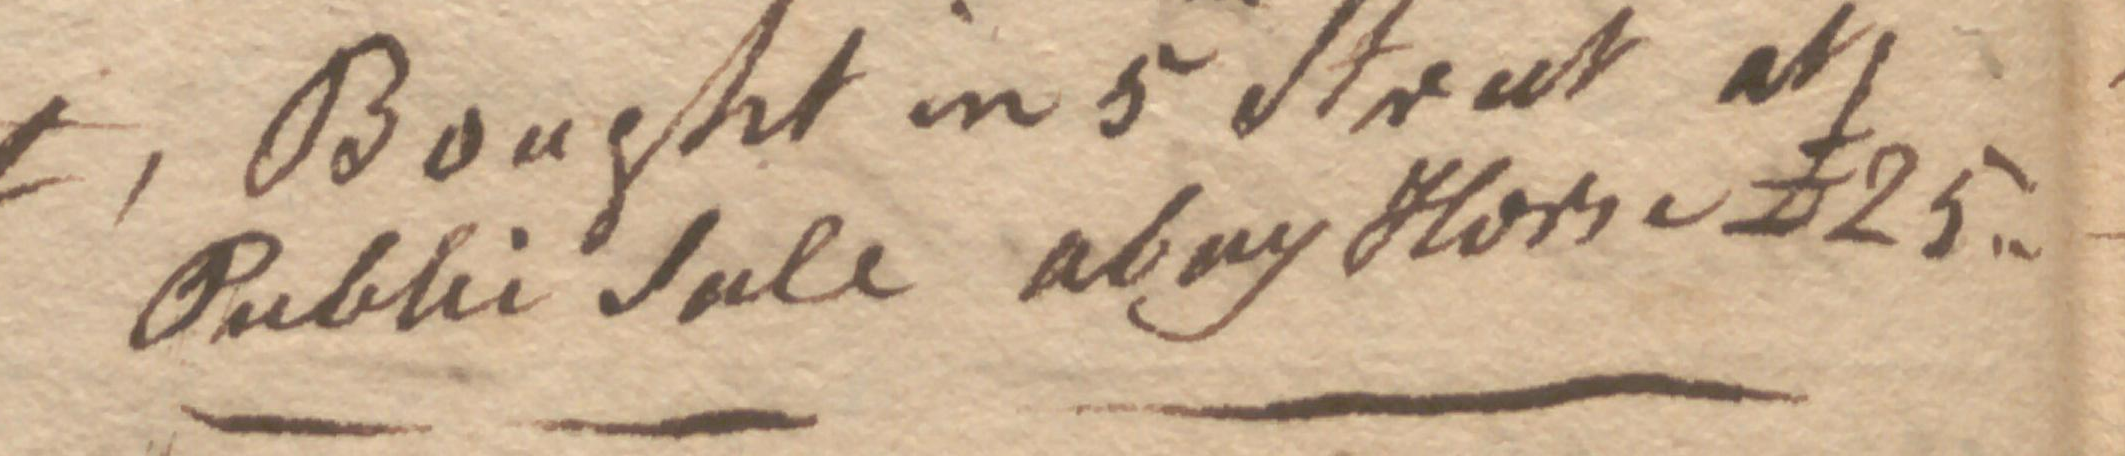Public Sale a bay Horse £25..
